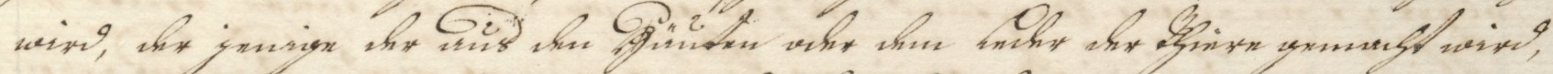wird, der jenige der aus den Häuten oder dem Leder der Thiere gemacht wird,
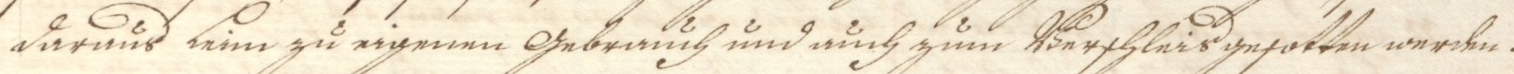daraus Leim zu eigenen Gebrauch und auch zum Verschleis gesotten werden.
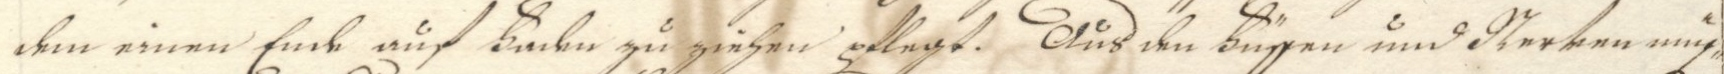dem einen Ende auf Faden zu ziehen pflegt. Aus den Füssen und Nerven müs-
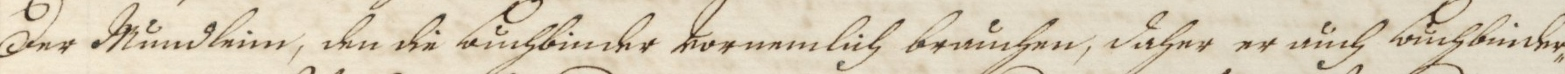Der Mundleim, den die Buchbinder vornemlich brauchen, daher er auch Buchbinder-
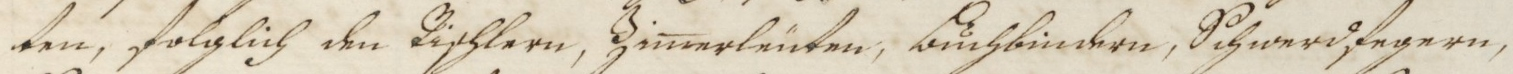ten, folglich den Tischlern, Zimmerleüten, Buchbindern, Schwerdfegern,
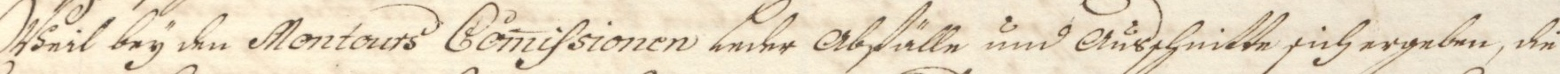Weil bey den Montours Commissionen Leder Abfälle und Ausschnitte sich ergeben, die
